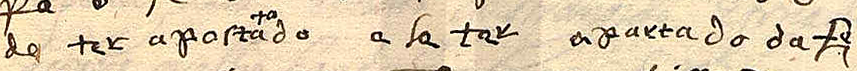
de ter apostatado e se ter apartado da fe
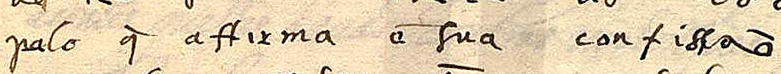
pelo q̄ affirma ē sua confissaõ
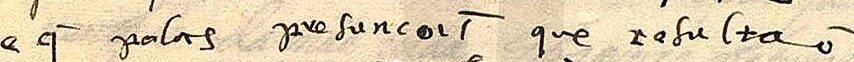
e q̄ polas presunçoĩs que resultaõ
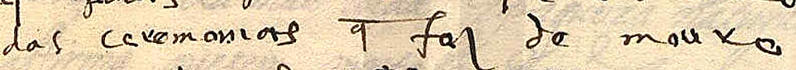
das ceremonias q̄ fez de mouro
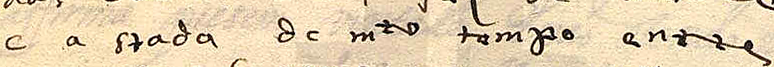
e a stada de mto tempo entre
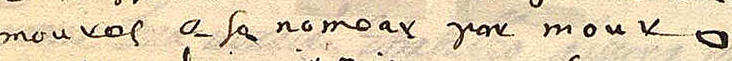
mouros e se nomear por mouro
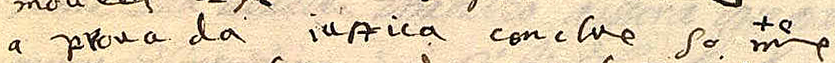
a proua da iustiça conclue somete
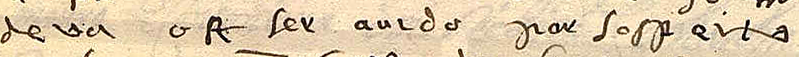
deva o R ser auido por sospeito
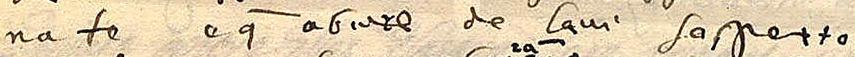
nate e q̄ abiure de leui sospeito
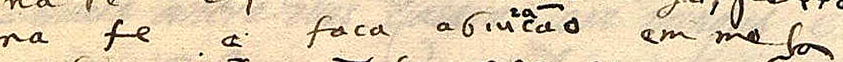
na fe e faça abiuraçaõ em mesa
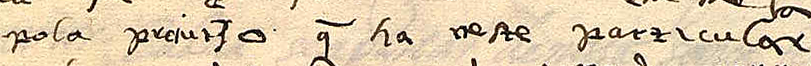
pola preiuiso q̄ ha neste particular
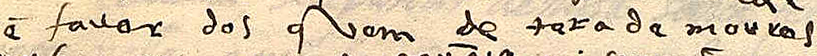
ē fauor dos q̄ vem de tera de mouros
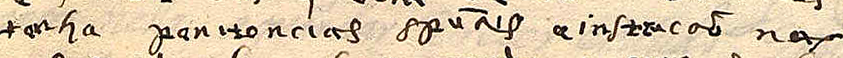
tenha penitencias spuāis e instruçaõ nas
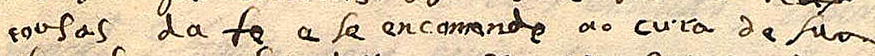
cousas da fe e se encomende ao cura de sua
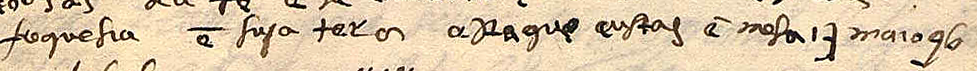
freguesia ē sua tera e pague custas ē mesa i7 maio 96
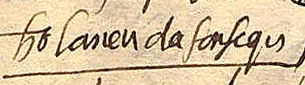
b̄olameu da fonseqa
